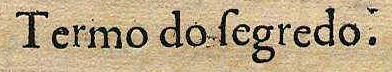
Termo do segredo.
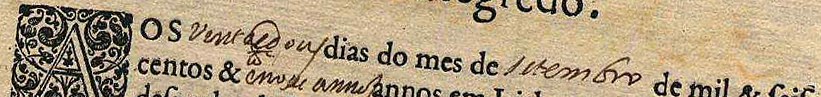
AOS vinte e dous dias do mes de setembro de mil & seis
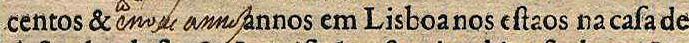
centos & e noue annos annos em Lisboa nos estaos na casa de
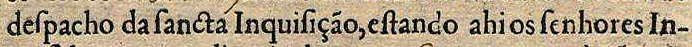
despacho da sancta Inquisição, estando ahi os senhores In
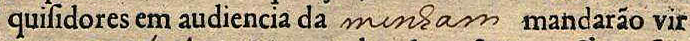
quisidores em audiencia da menham mandarão vir
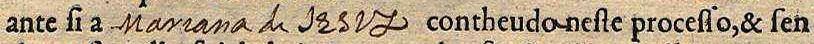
ante si a Mariana de IESVS contheuda neste processo, & sen
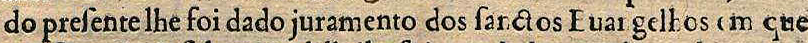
do presente lhe foi dado juramento dos sanctos Euangelhos em que
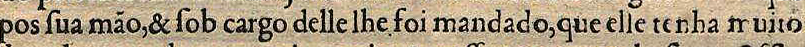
pos sua mão, & sob cargo delle lhe foi mandado, que elle tenha muito
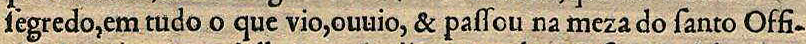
segredo, em tudo o que vio, ouuio, & passou na meza do santo Offi
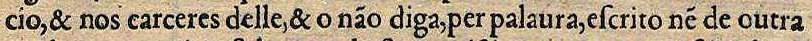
cio, & nos carceres delle, & o não diga, per palaura, escrito nē de outra
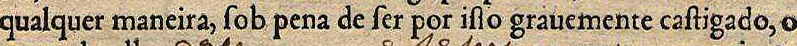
qualquer maneira, sob pena de ser por isso grauemente castigado, o
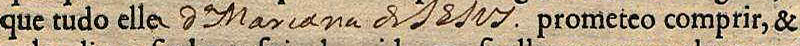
que tudo ella da Mariana de IESVS. prometeo comprir, &
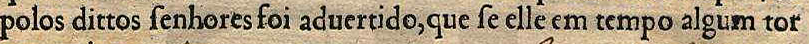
polos dittos senhores foi aduertido, que se elle em tempo algum tor
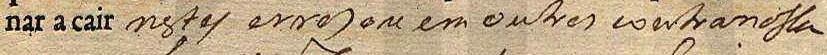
nar a cair nestes erros ou em outros contra nossa
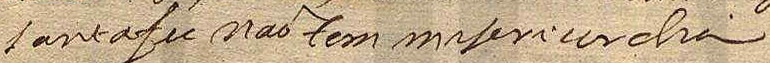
santa fee naõ tera misericordia
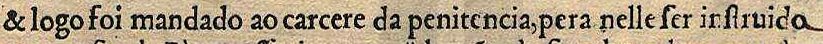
& logo foi mandado ao carcere da penitencia, pera nelle ser instruida
